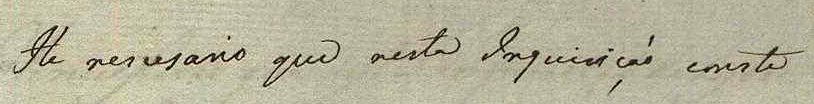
He nescesario que nesta Inquiziçaõ conste
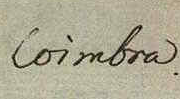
Coimbra.
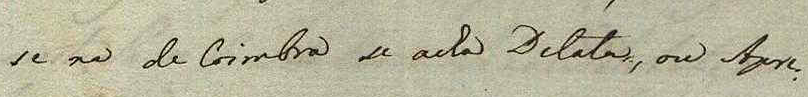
se na de Coimbra se acha Delata, ou Apre
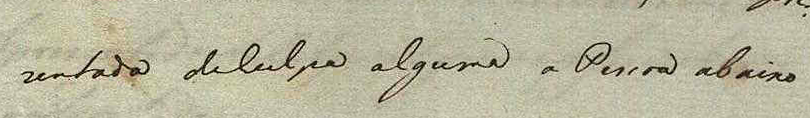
zentada de Culpa alguma a Pessoa abaixo
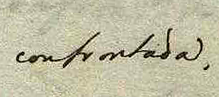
confrontada,
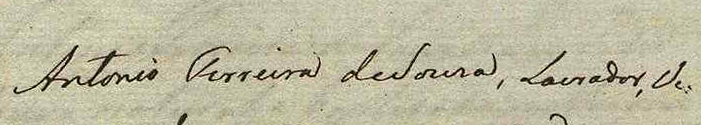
Antonio Ferreira de Souza, Lavrador, Ve
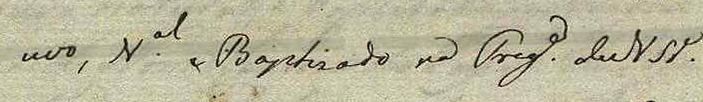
uvo, N.al e Baptizado na Freg.a de N Sr.a
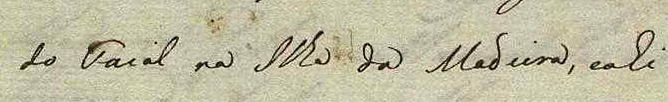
do Faial na Ilha da Madeira, e ahi
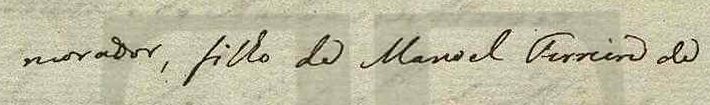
morador, filho de Manoel Ferreira de
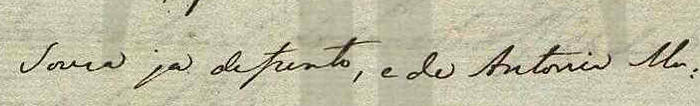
Souza ja defunto, e de Antonia Ma
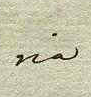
ria
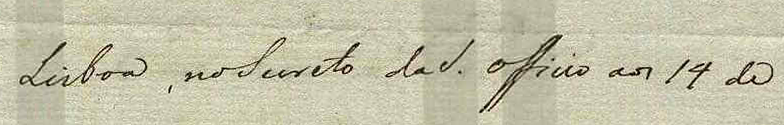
Lisboa, no Secreto do S. officio aos 14 de
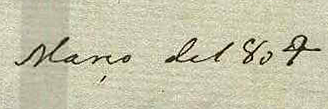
Março de 1804
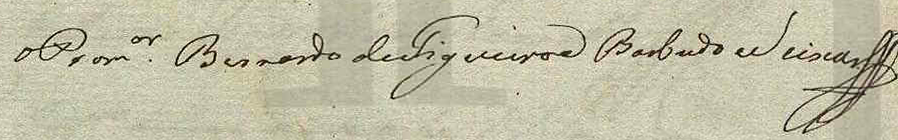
o Prom.or Bernardo de Figueiroa Barbudo e Seixas
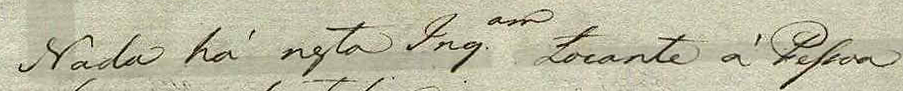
Nada há nesta Inq.am tocante á Pessoa
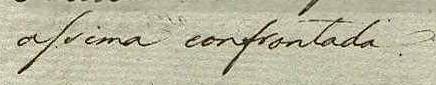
assima confrontada
